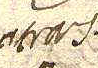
atras.
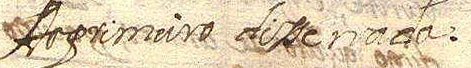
Ao primeiro disse nada.
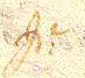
Jd.e
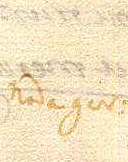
nada ger:
